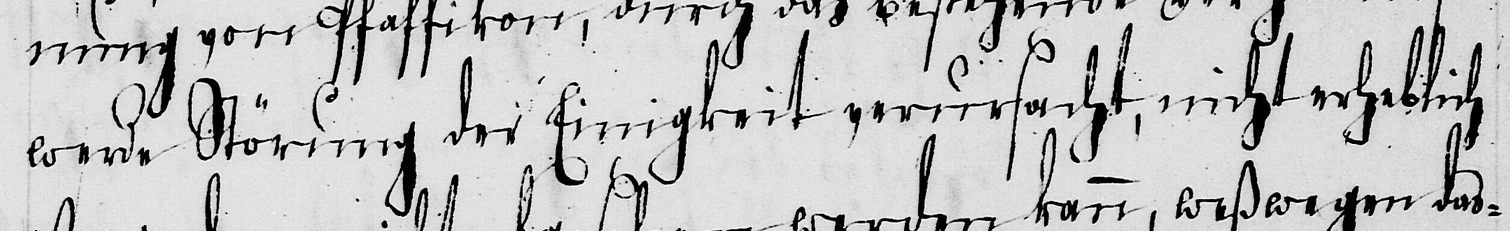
werde Störung der Einigkeit verursacht, nicht erheblich
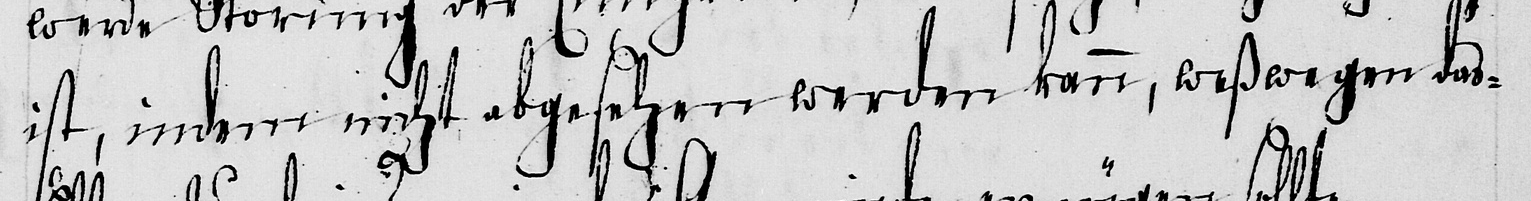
ist, indem nicht abgesehen werden kann, weßwegen das¬
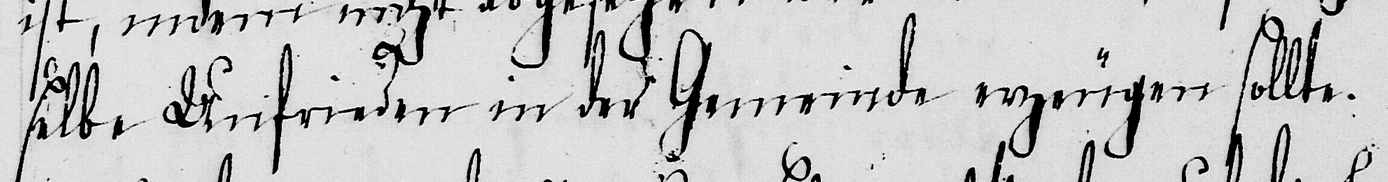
selbe Unfrieden in der Gemeinde erzeugen sollte.
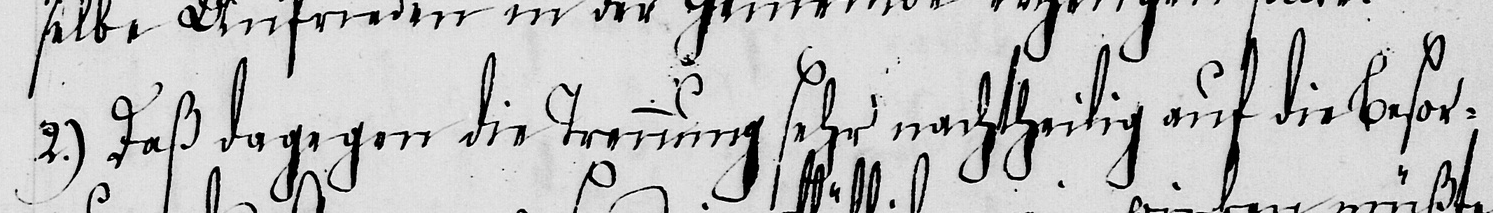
2.) Daß dagegen die Trennung sehr nachtheilig auf die Beso¬
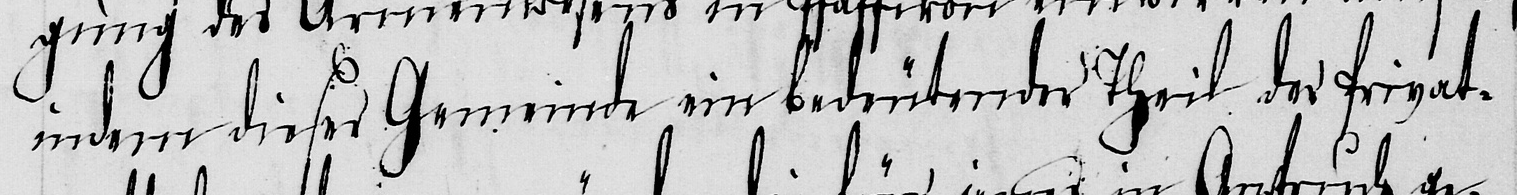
indem dieser Gemeinde ein bedeutender Theil der Privat¬
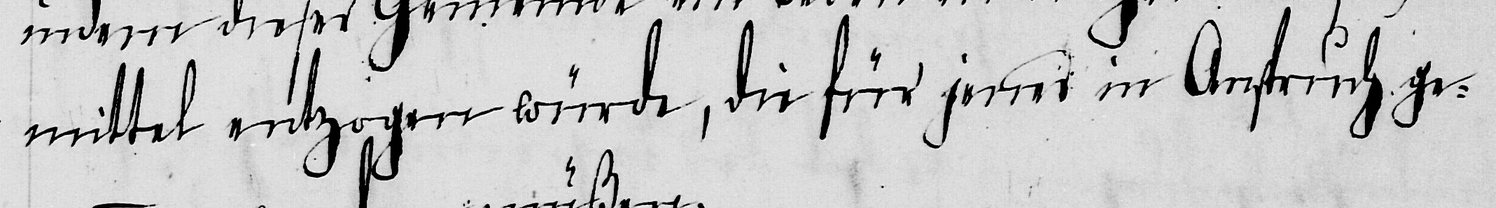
mittel entzogen würde, die für jenes in Anspruch ge¬
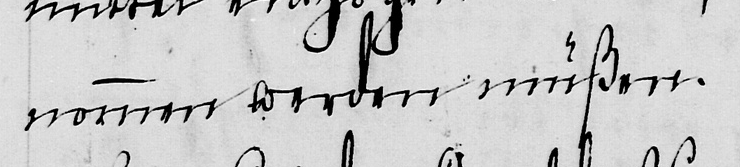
nommen werden müßen.
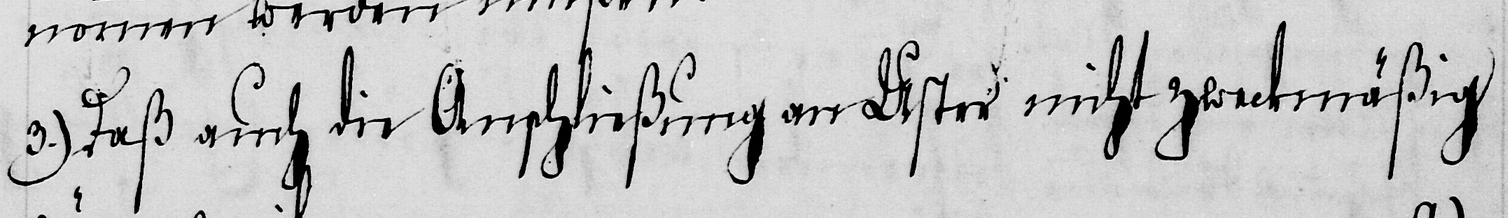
3.) Daß auch die Anschließung an Uster nicht zweckmäßig
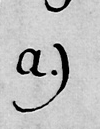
3.)
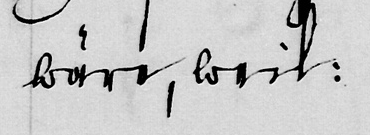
wäre, weil:
